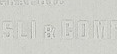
Zürich, 20. Janr
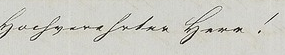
Hochverehrter Herr!
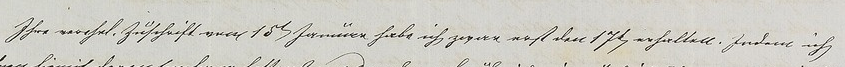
Ihre verehrl. Zuschrift vom 15ten Januar habe ich zwar erst den 17ten erhalten. Indem ich
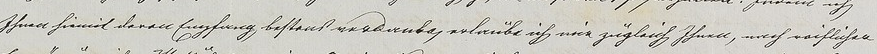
Ihnen hiemit deren Empfang bestens verdanke, erlaube ich mir zugleich Ihnen, nach reichlicher
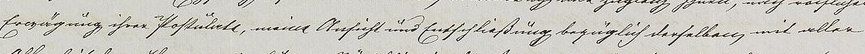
Erwägung ihrer Postulate, meine Ansicht und Entschließung bezüglich derselben mit aller
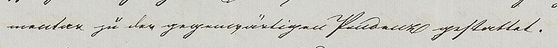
mentar zu der gegenwärtigen Pendenz gestattet.
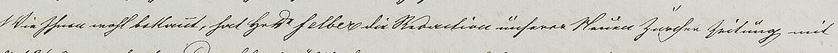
Wie Ihnen wohl bekannt, hat Hr DrFelber die Redaction unserer Neuen Zürcher Zeitung mit
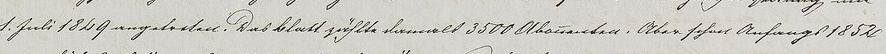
1. Juli 1849 angetreten. Das Blatt zählte damals 3500 Abonnenten. Aber schon Anfangs 1852
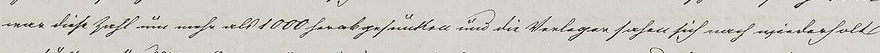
war diese Zahl um mehr als 1000 herabgesunken und die Verleger sahen sich nach wiederholt
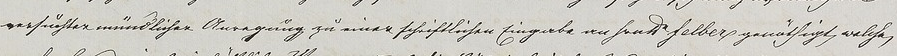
versuchter mündlicher Anregung zu einer schriftlichen Eingabe an Hrn DrFelber genöthigt, welche
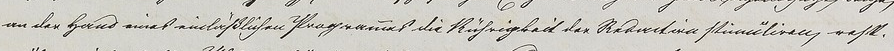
an der Hand eines einläßlichen Programmes die Rührigkeit der Redaction stimuliren resp.
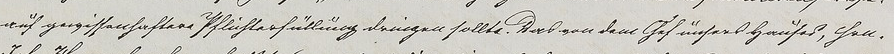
auf gewissenhaftere Pflichterfüllung dringen sollte. Das von dem Chef unsers Hauses, Hrn.
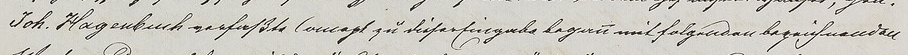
Joh. Hagenbuch verfaßte Concept zu dieser Eingabe begann mit folgenden bezeichnenden
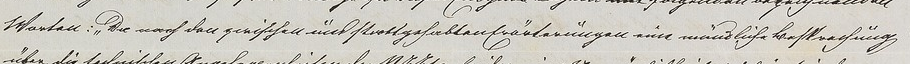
Worten: «Da nach den zwischen uns stattgehabten Erörterungen eine mündliche Besprechung
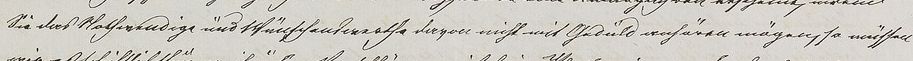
Sie das Nothwendige und Wünschenswerthe davon nicht mit Geduld anhören mögen, so müssen
